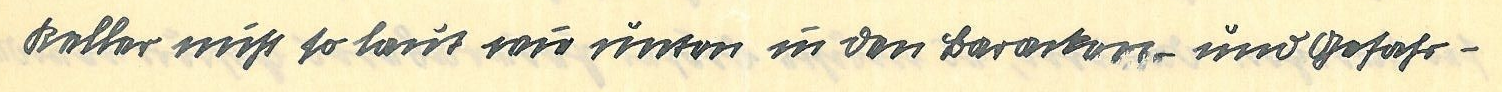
Keller nicht so laut wie unten in den Baracken – und Gefahr –
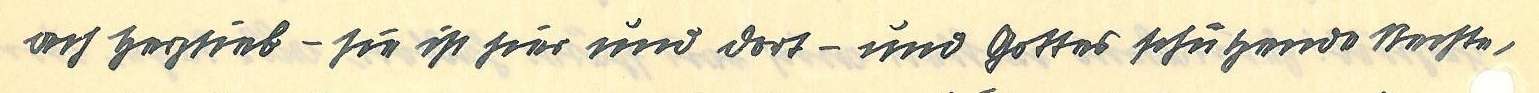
ach Herzlieb – sie ist hier und dort – und Gottes schützende Rechte,
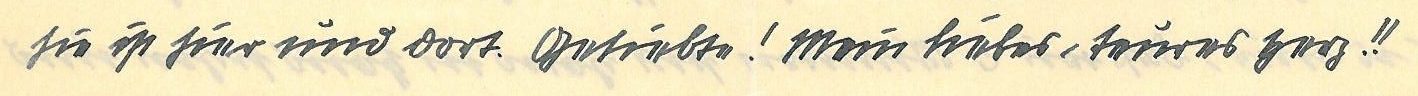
sie ist hier und dort. Geliebte! Mein liebes teures Herz!!
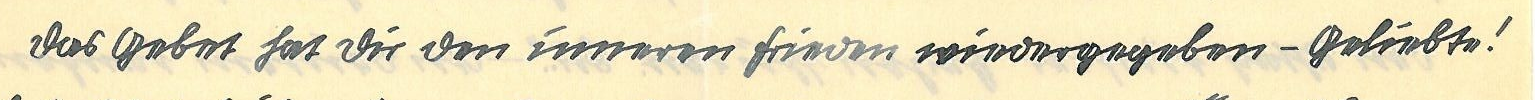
Das Gebet hat Dir den inneren Frieden wiedergegeben – Geliebte!
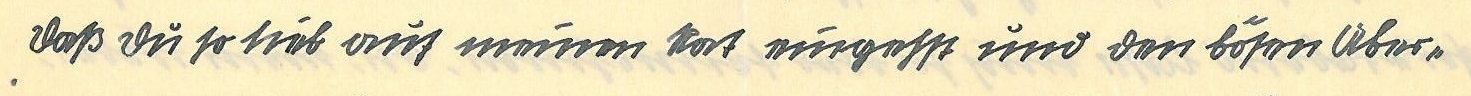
Daß Du so lieb auf meinen Rat eingehst und den bösen Aber¬
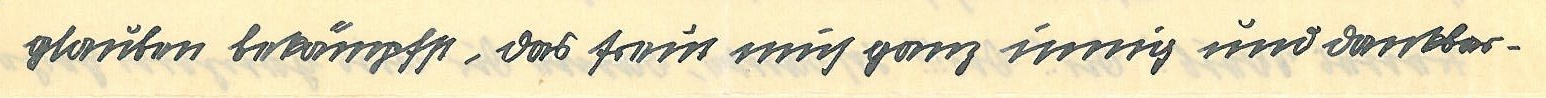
glauben bekämpfst, das freut mich ganz innig und dankbar –
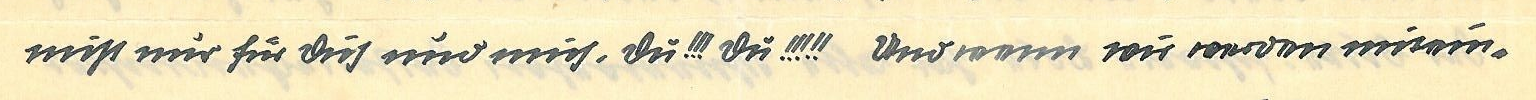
nicht nur für Dich und mich. Du!!! Du!!!!! Und wenn wir werden mitein¬
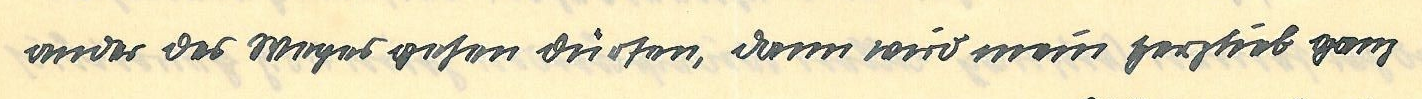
ander des Weges gehen dürfen, dann wird mein Herzlieb ganz
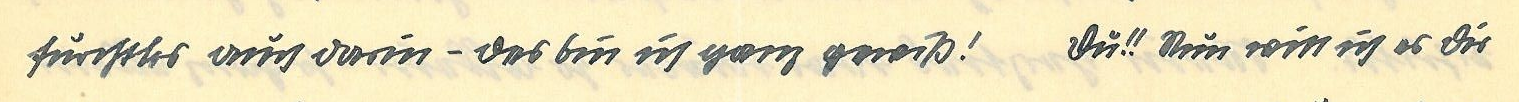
furchtlos auch darin – des bin ich ganz gewiß! Du!! Nun will ich es Dir
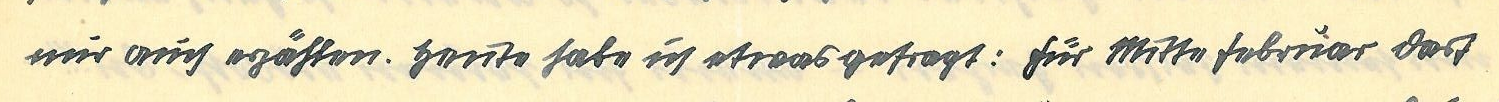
nur auch erzählen. Heute habe ich etwas gefragt: Für Mitte Februar darf
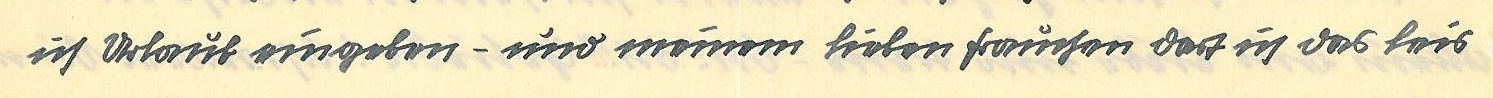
ich Urlaub eingeben – und meinem lieben Frauchen darf ich das leis
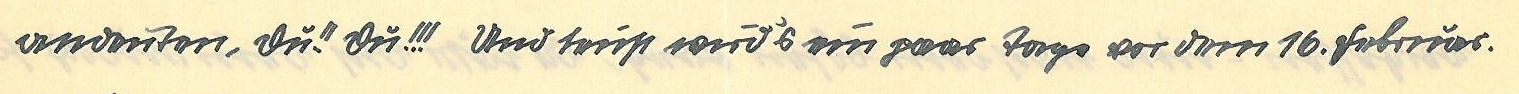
andeuten, Du!! Du!!! Und leicht wird’s ein paar Tage vor dem 16. Februar.
